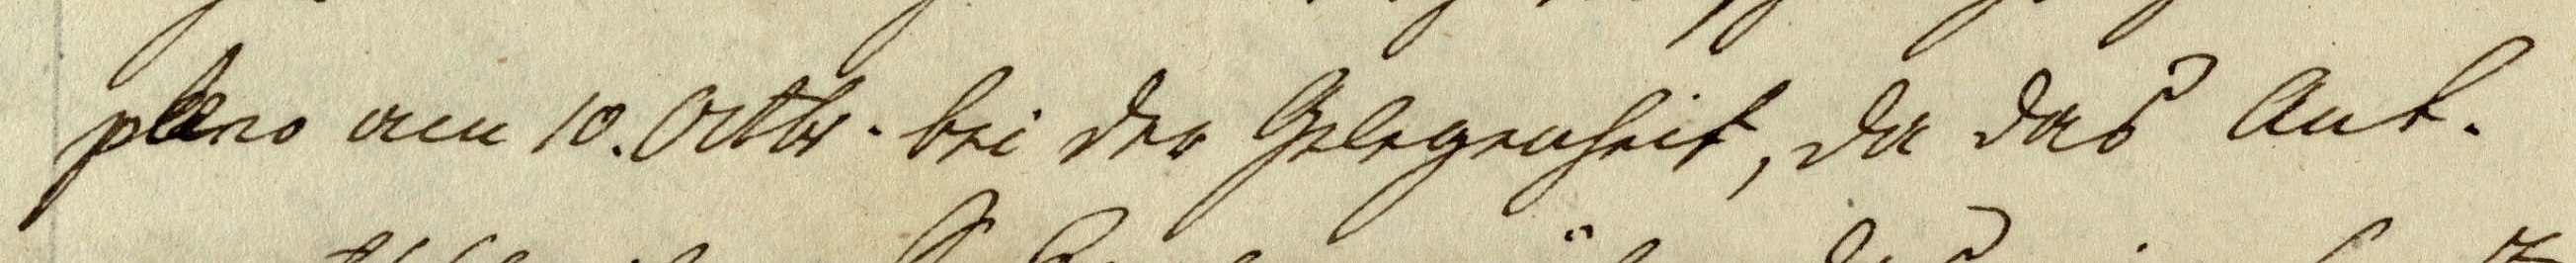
pleno am 10 Octbr. bei der Gelegenheit, da das Ant¬
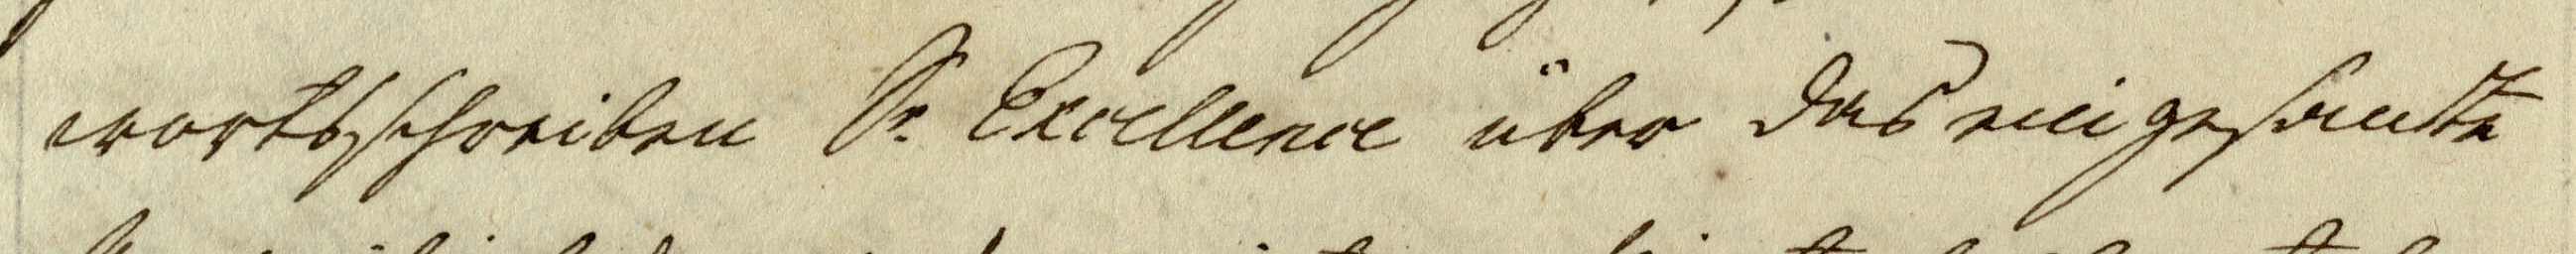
wortschreiben Sr Excellence über das eingesandte
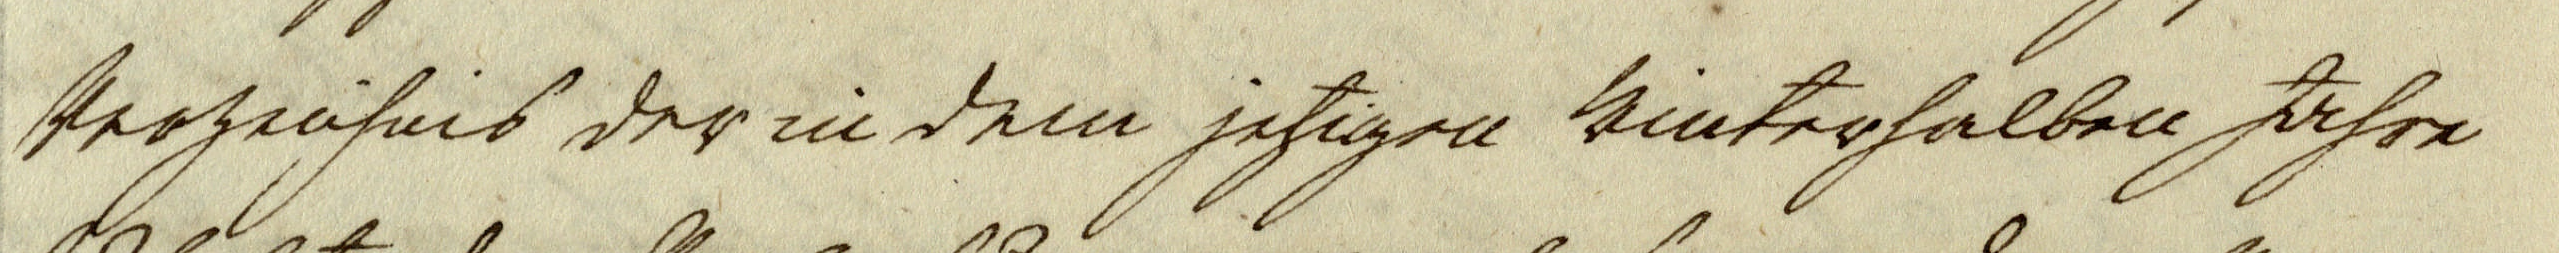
Verzeichnis der in dem jetzigen Winterhalben Jahre
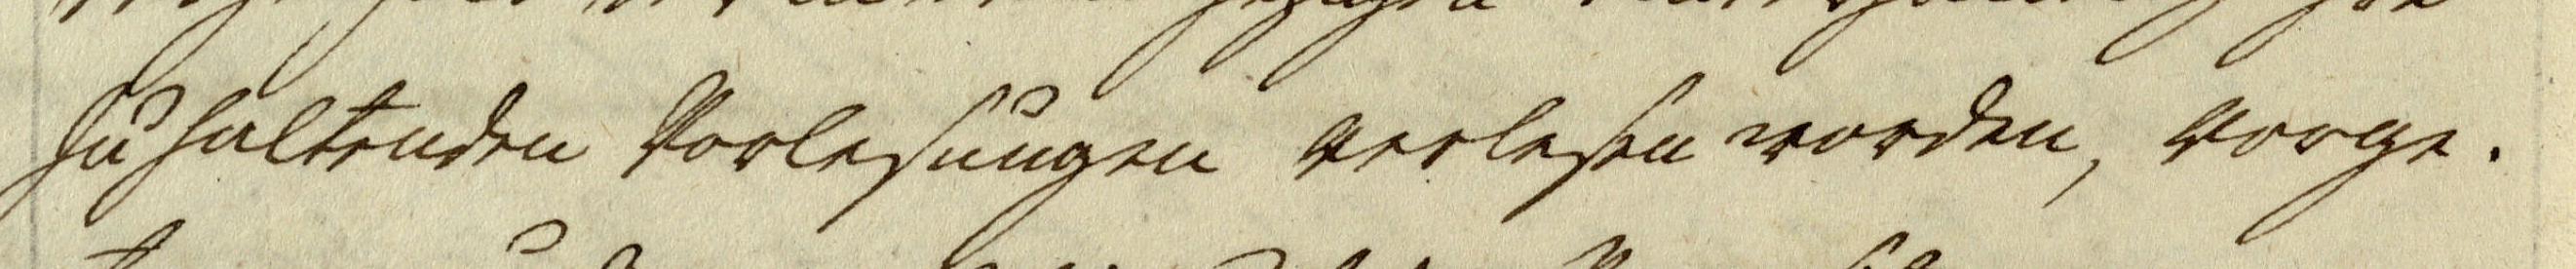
zu haltenden Vorlesungen verlesen worden, vorge¬
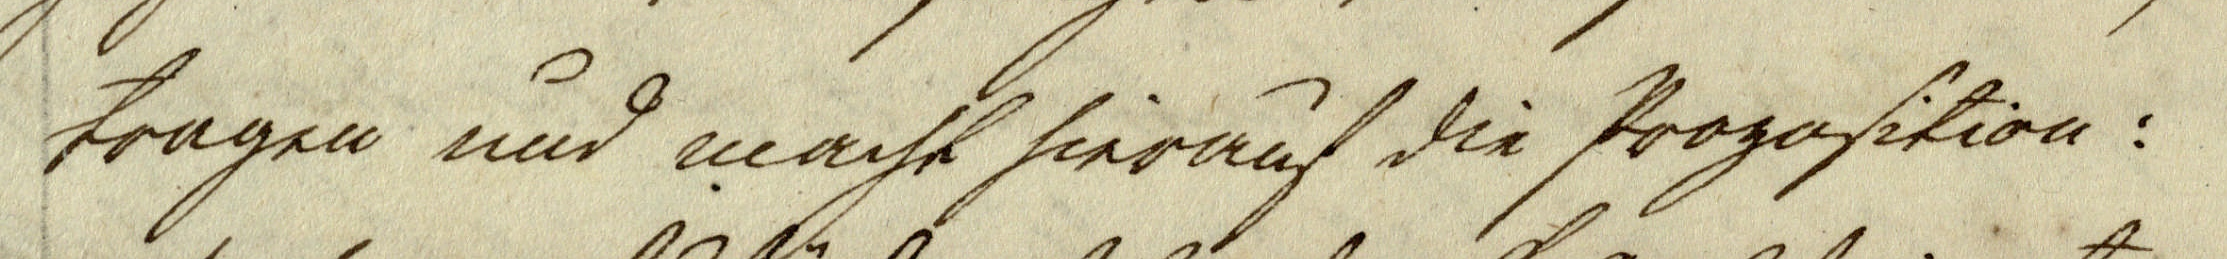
tragen und macht hierauf die Proposition:
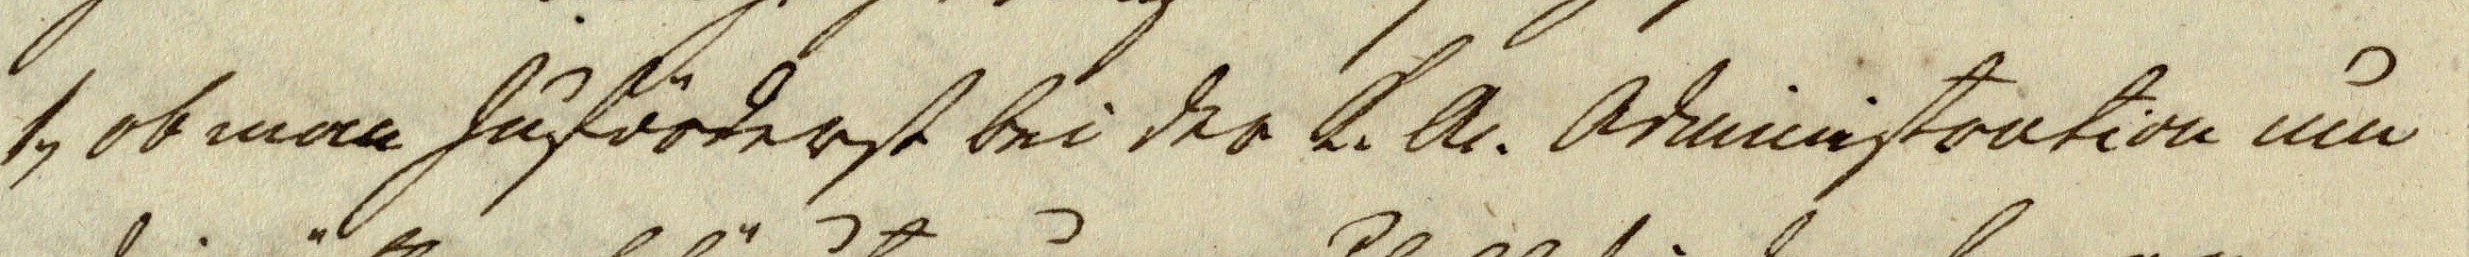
1, ob man zuförderst bei der K. A. Administration um
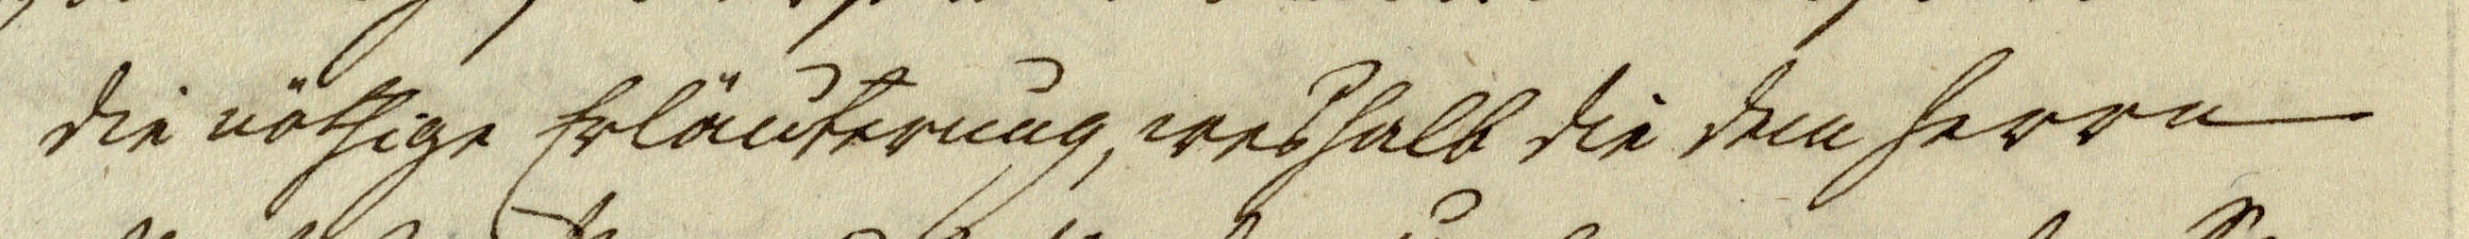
die nöthige Erläuterung, weshalb die dem Herrn
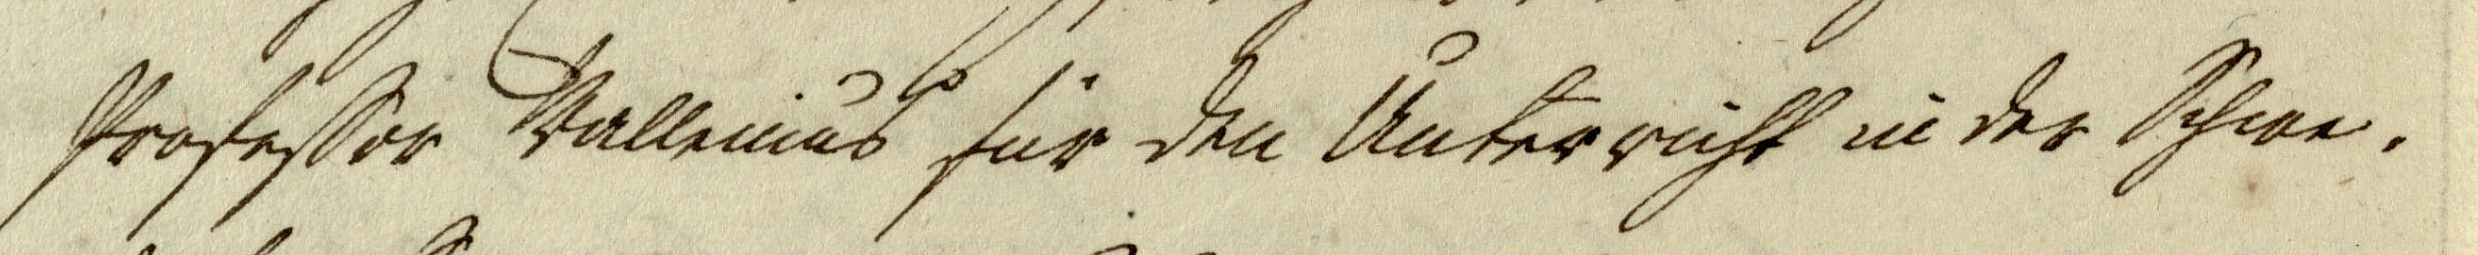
Professor Wakleius für den Unterricht in der Schwe¬
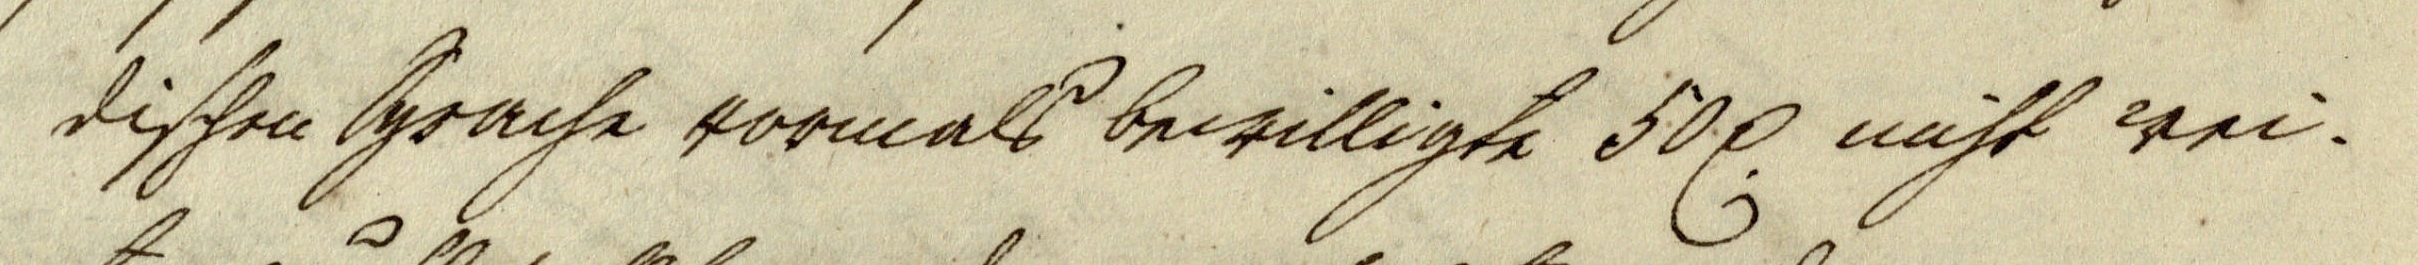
dischen Sprache vormals bewilligte 50 l. nicht wei¬
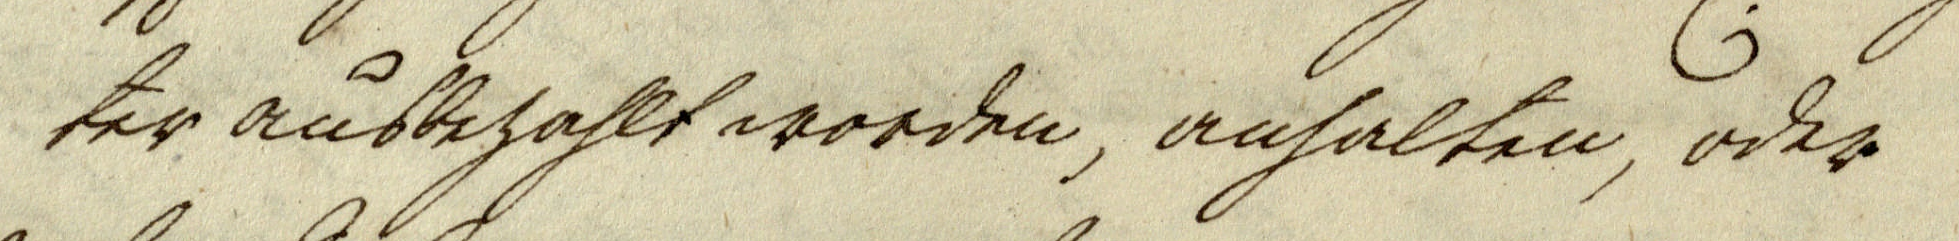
er ausbezahlt worden, anhalten, oder
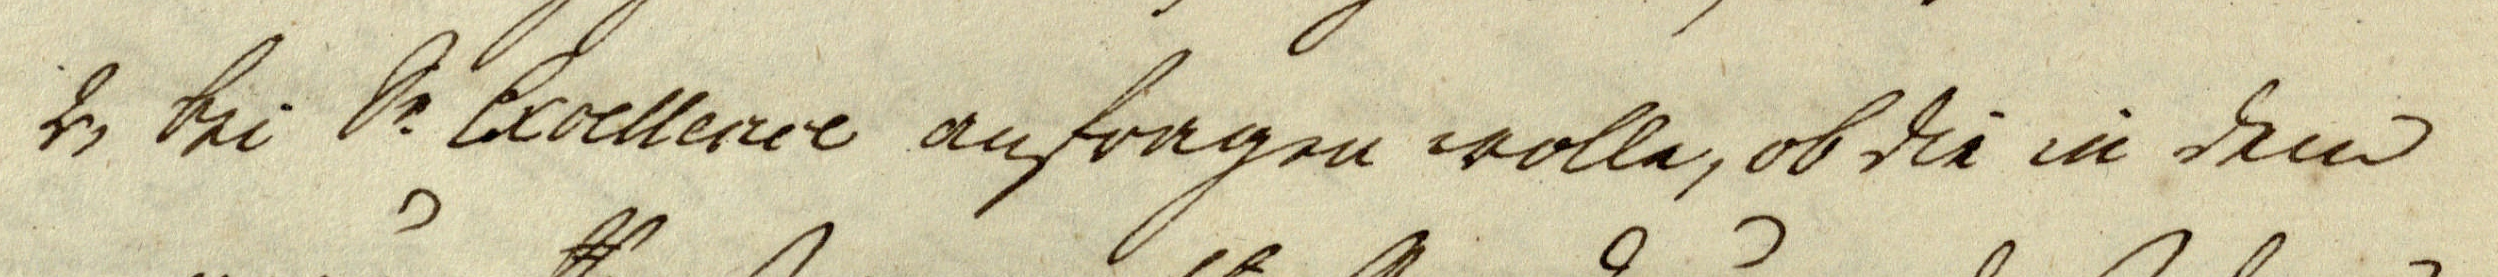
2., bei Sr Excellence anfragen wolle, ob die in dem
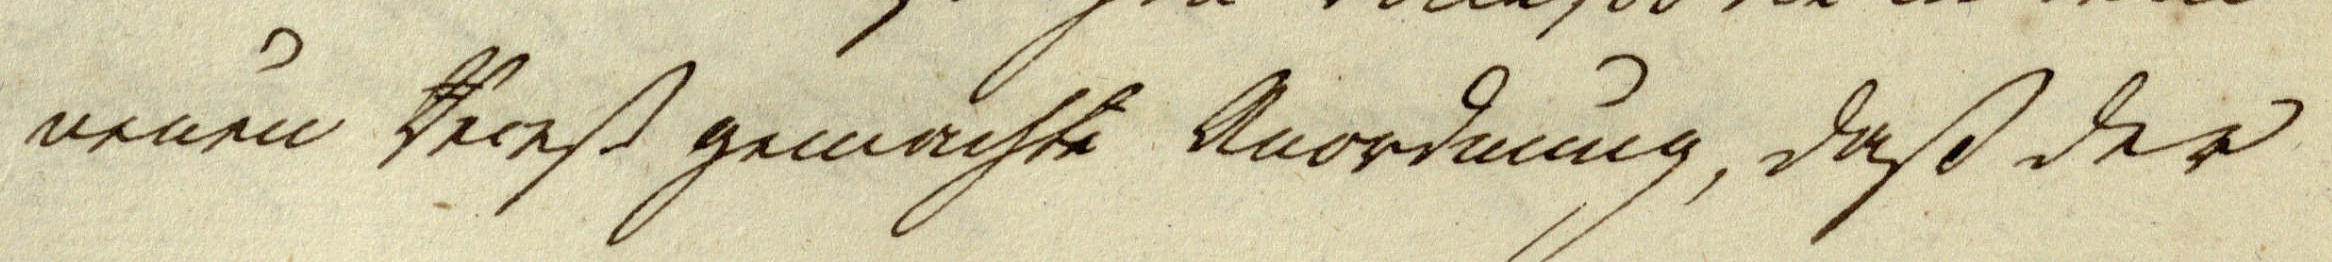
neuen Receß gemachte Anordnung, daß der
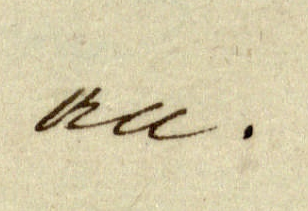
an¬
